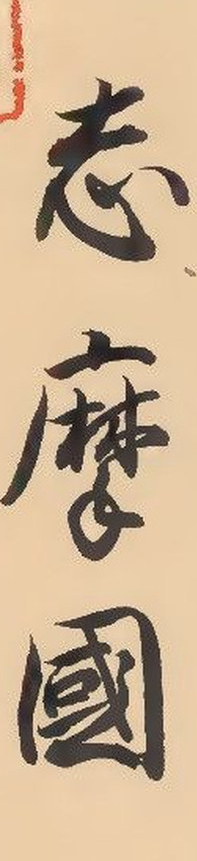志摩国
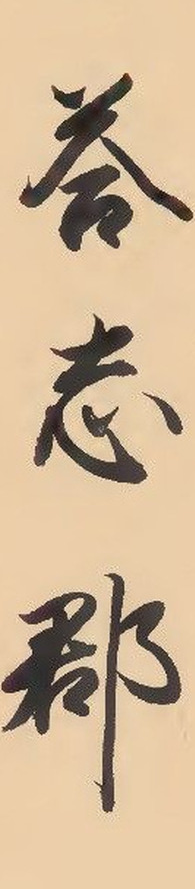答志郡
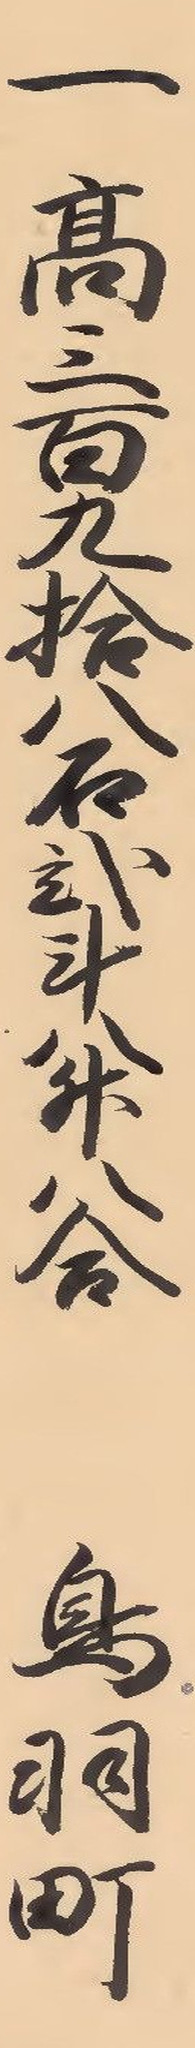一高三百九拾八石弐斗八升八合鳥羽町
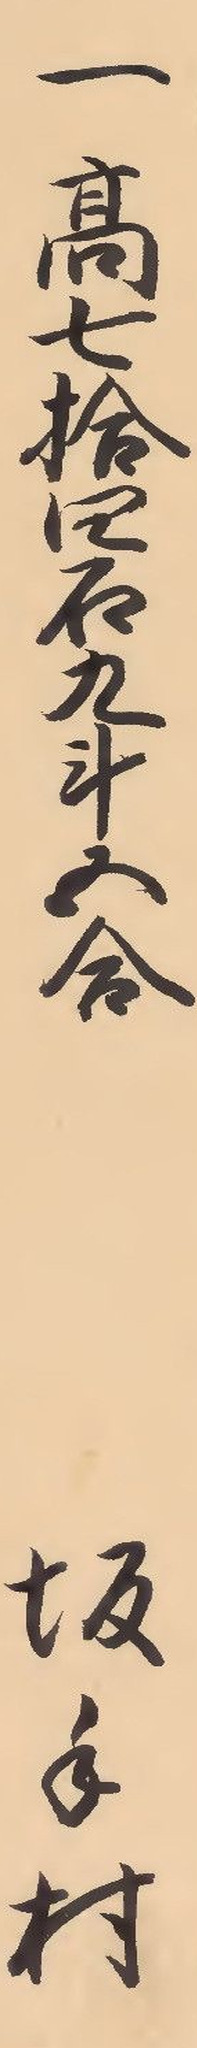一高七拾四石九斗五合坂手村

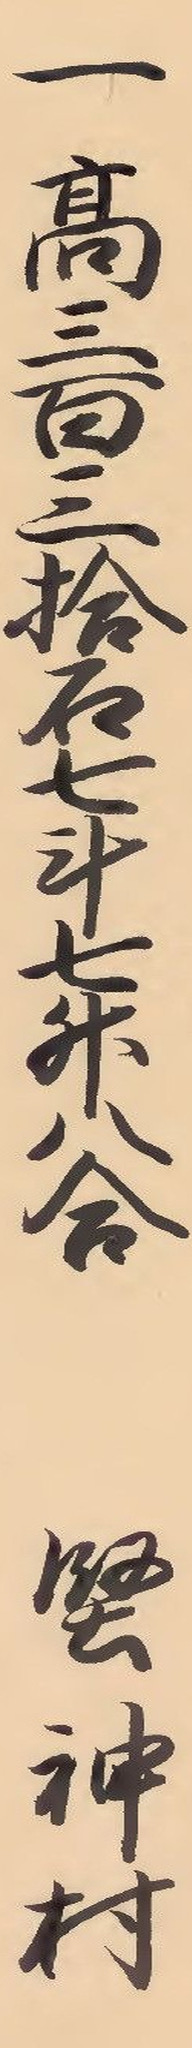一高三百三拾石七斗七升八合堅神村
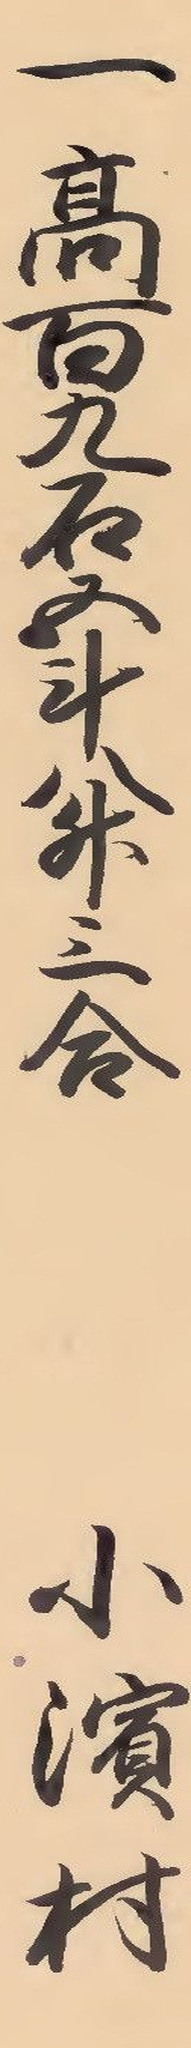一高百九石五斗八升三合小浜村
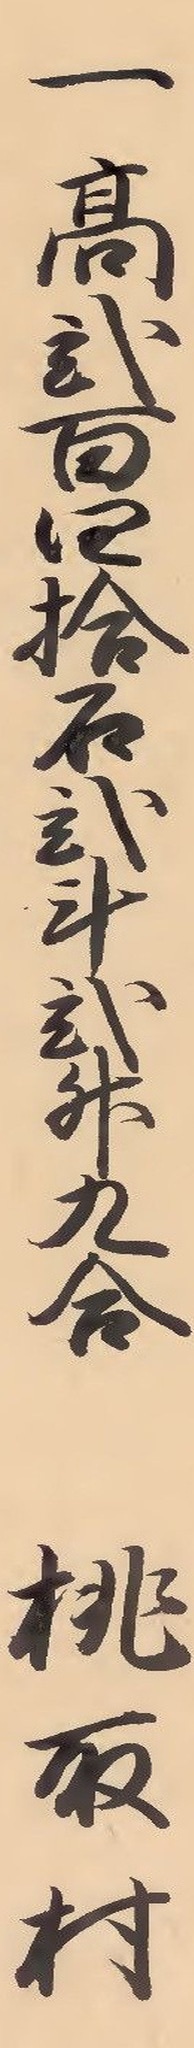一高弐百四拾石弐斗弐升九合桃取村
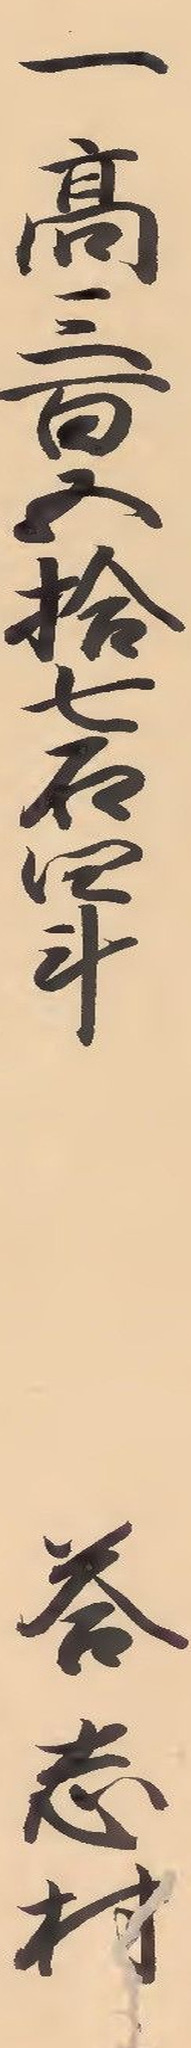一高三百五拾七石四斗答志村
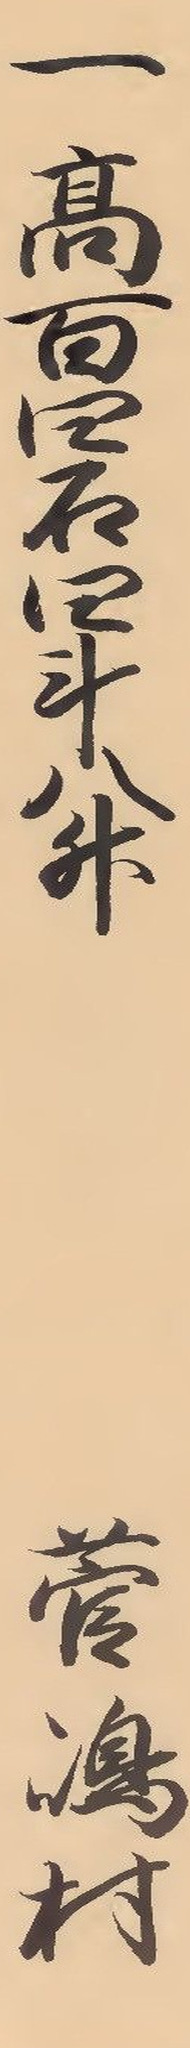一高百四石四斗八升菅島村
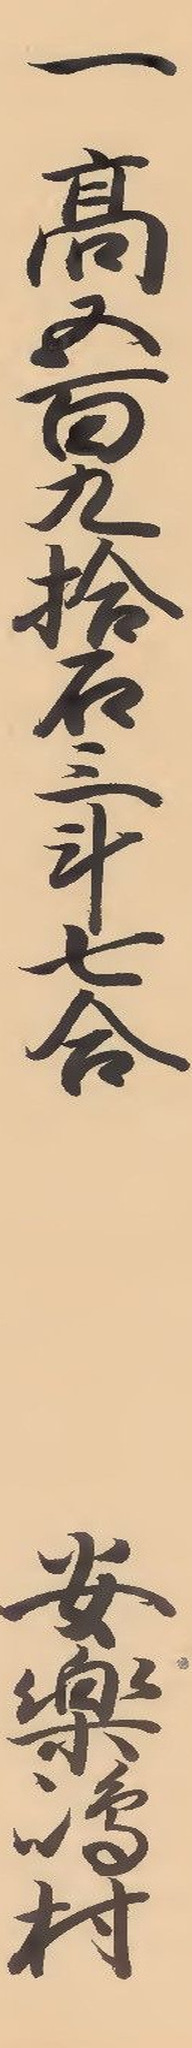一高五百九拾石三斗七合安楽島村
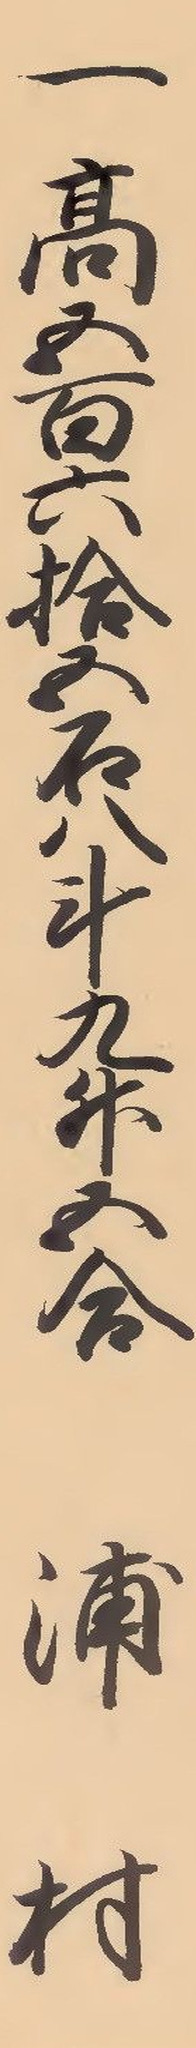一高五百六拾五石八斗九升五合浦村

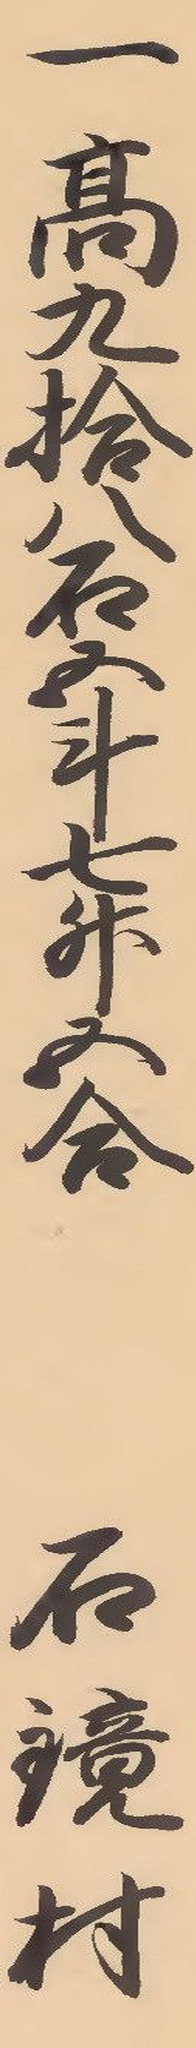一高九拾八石五斗七升五合石鏡村
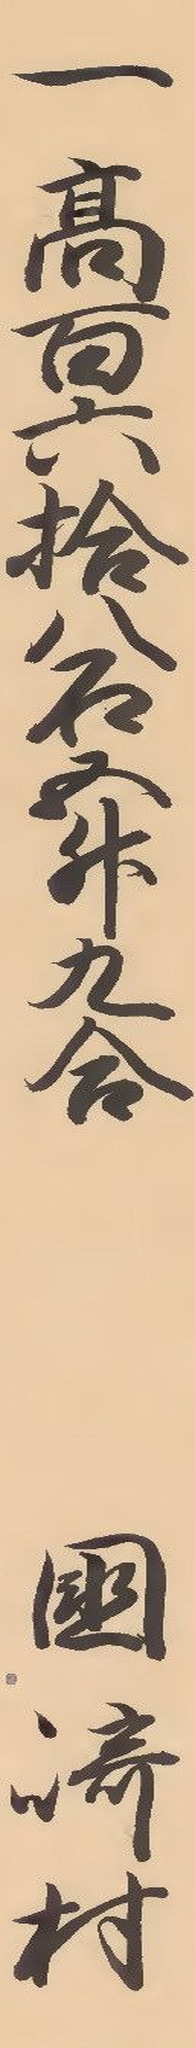一高百六拾八石五升九合国崎村
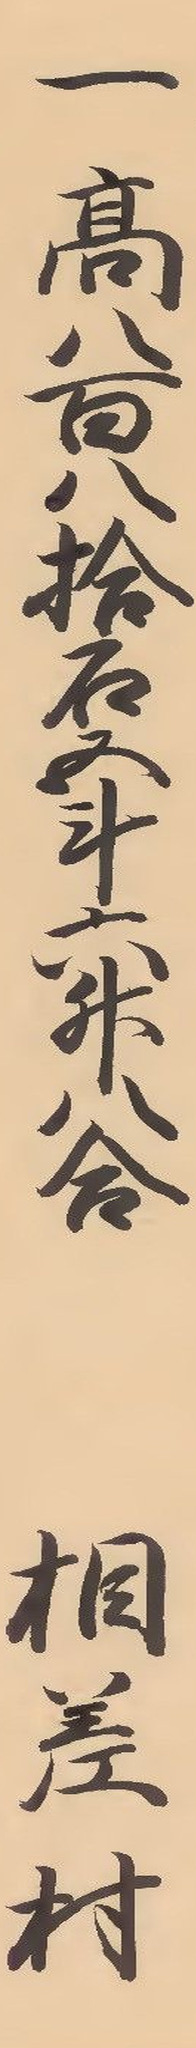一高八百八拾石五斗六升八合相差村
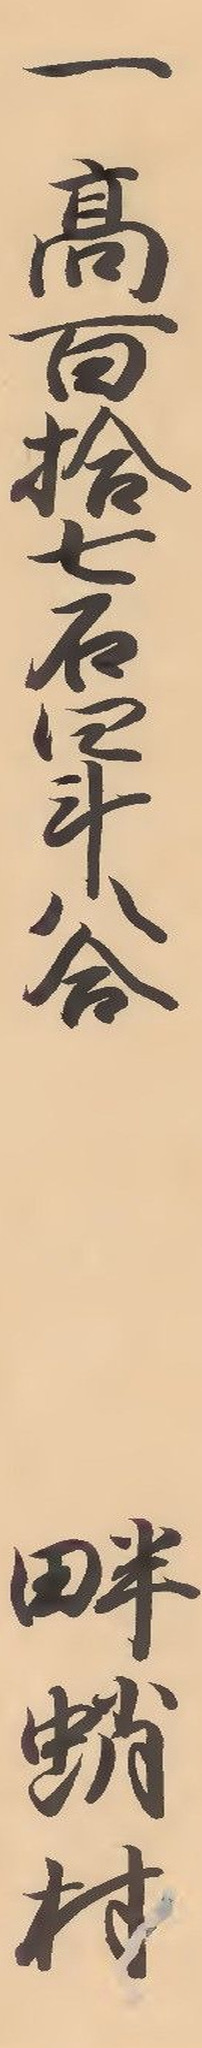一高百拾七石四斗八合畔蛸村
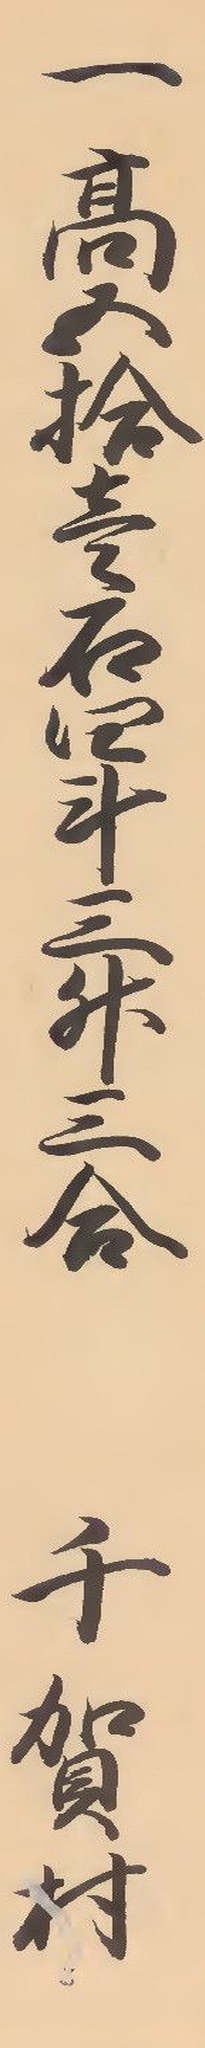一高五拾壱石四斗三升三合千賀村
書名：志摩国郷帳
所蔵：国立公文書館 National Archives of Japan
